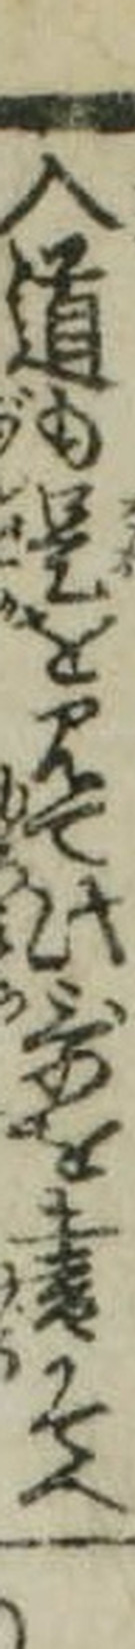入道も是を見て此歌を書そへ
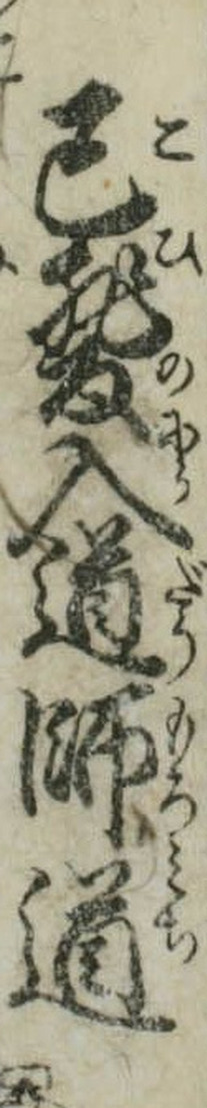己斐入道師道
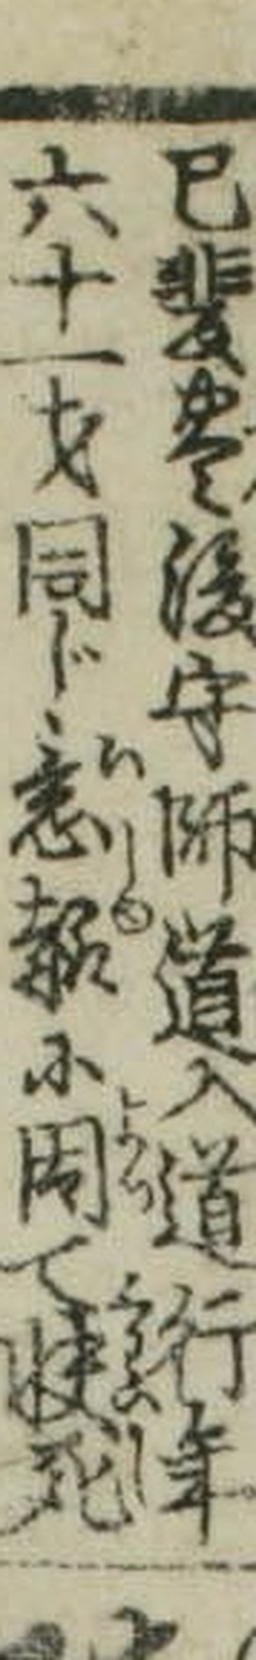六十一才同じ意趣に因て快死
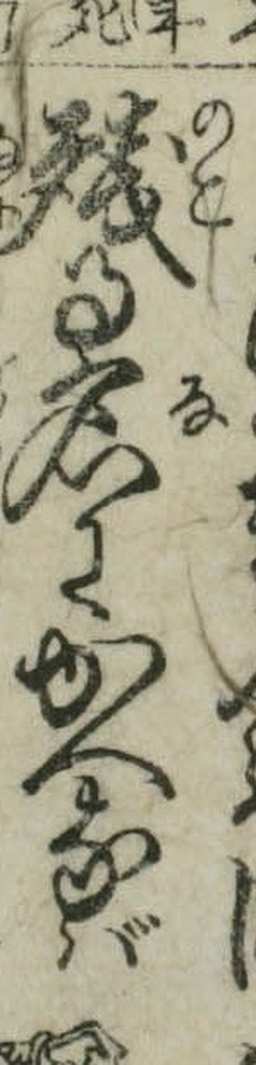残る名にかへなば
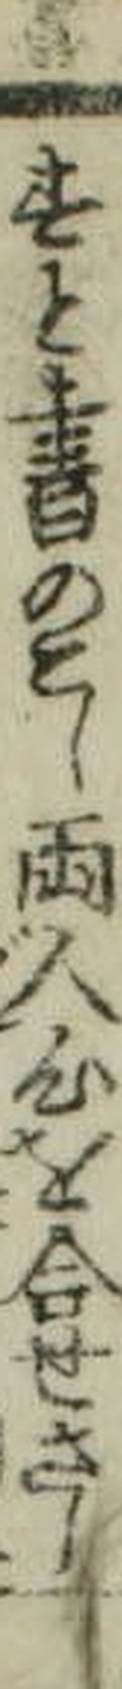すと書のこし両人心を合せさし
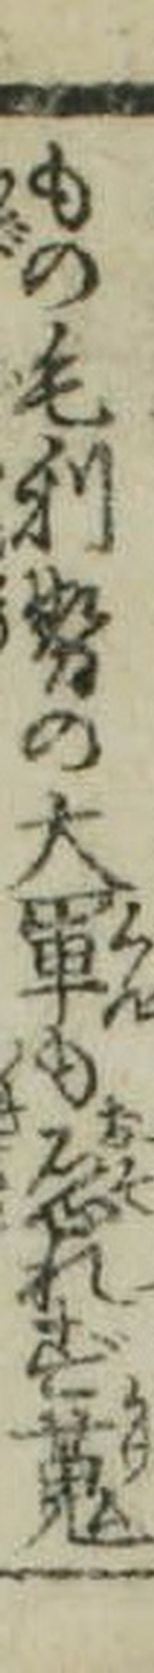もの毛利勢の大軍も恐れず蒐
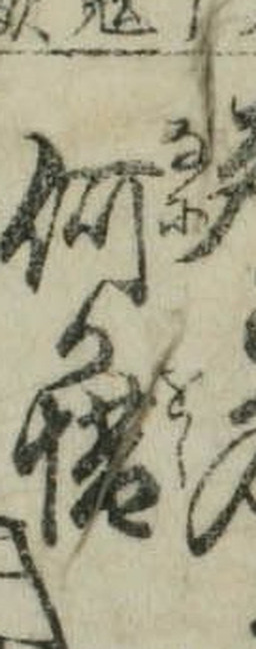何か惜
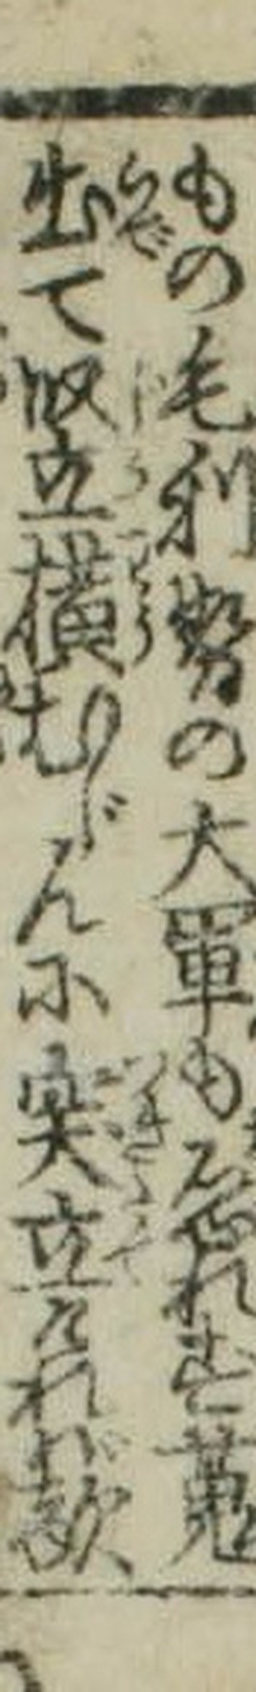出て竪横むじんに突立ければ敵
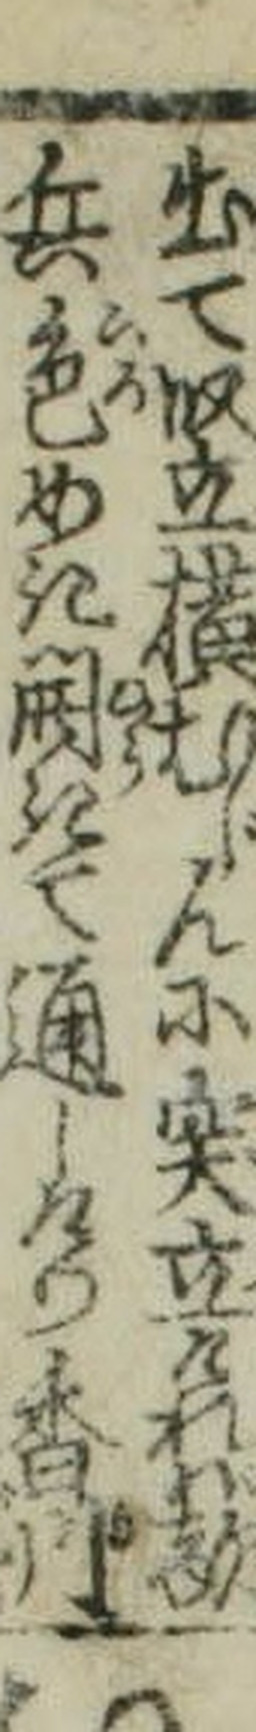兵色めき開きて通しけり香川
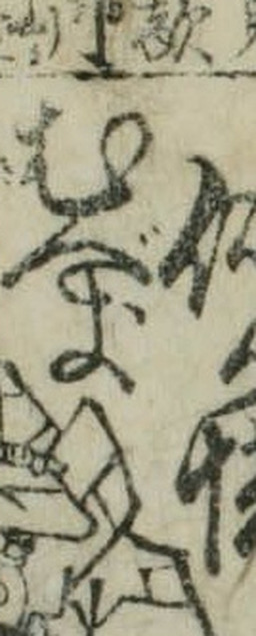むべき
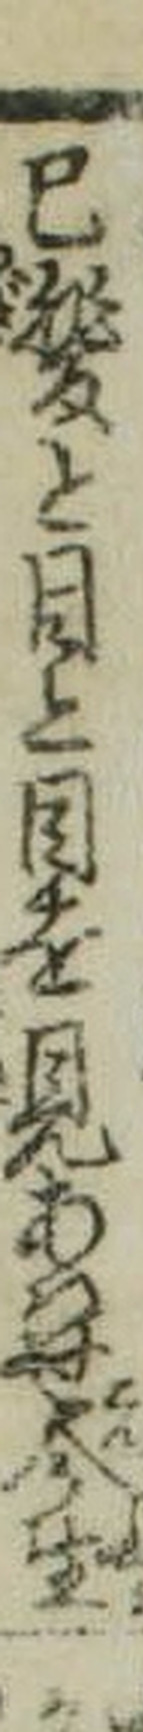己斐と目と目を見あはせ今生
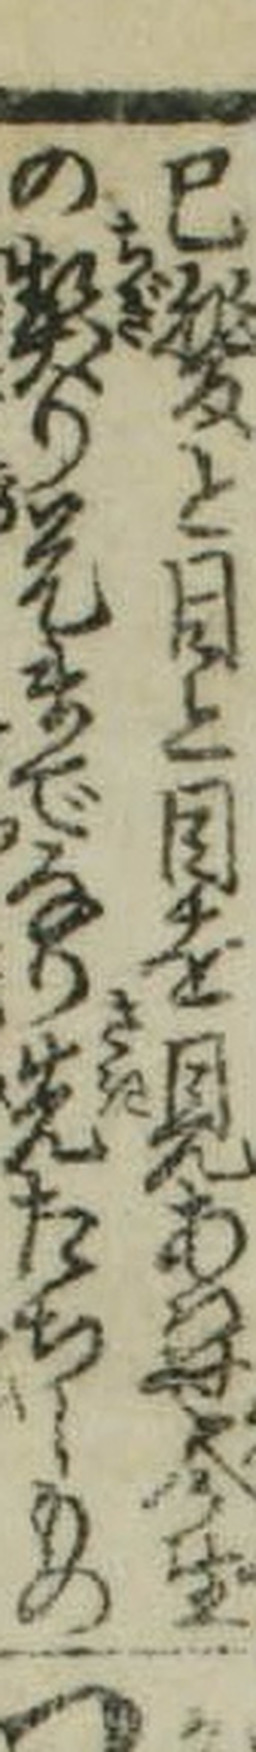の契り是までなり先たちしもの
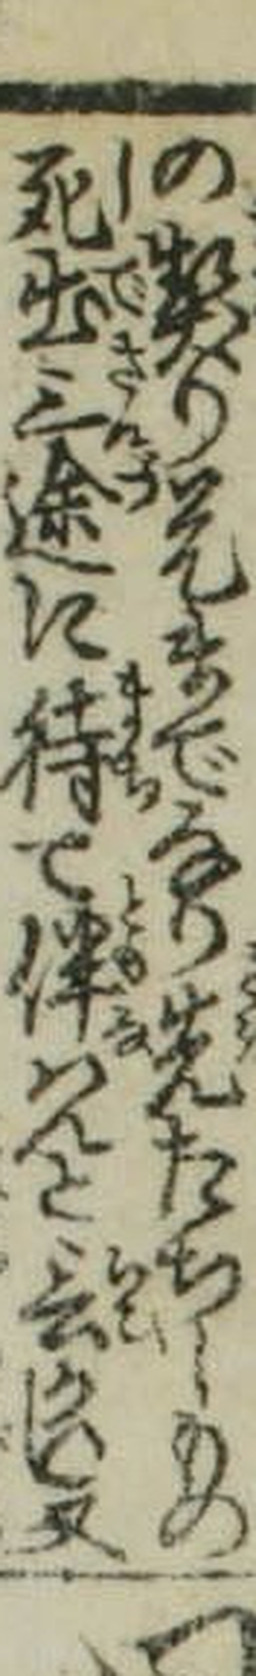死出三途に待て伴はんと言かはし又
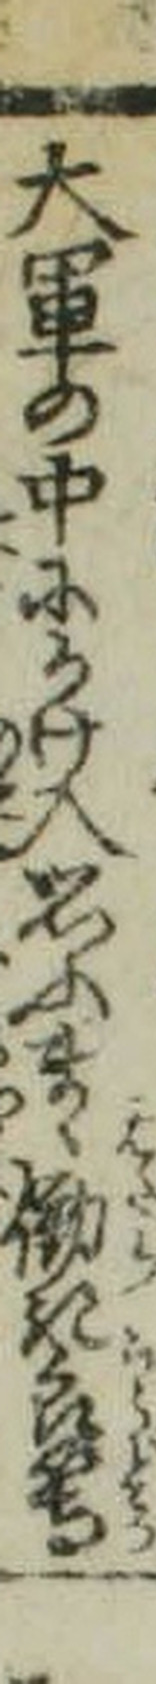大軍の中にかけ入思ふまゝ働き郎等
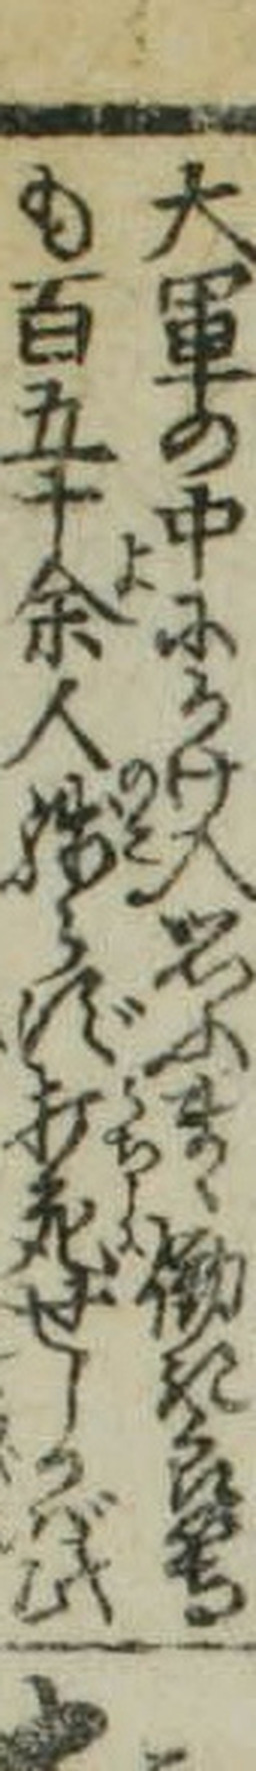も百五十余人残らず打死せしかば此
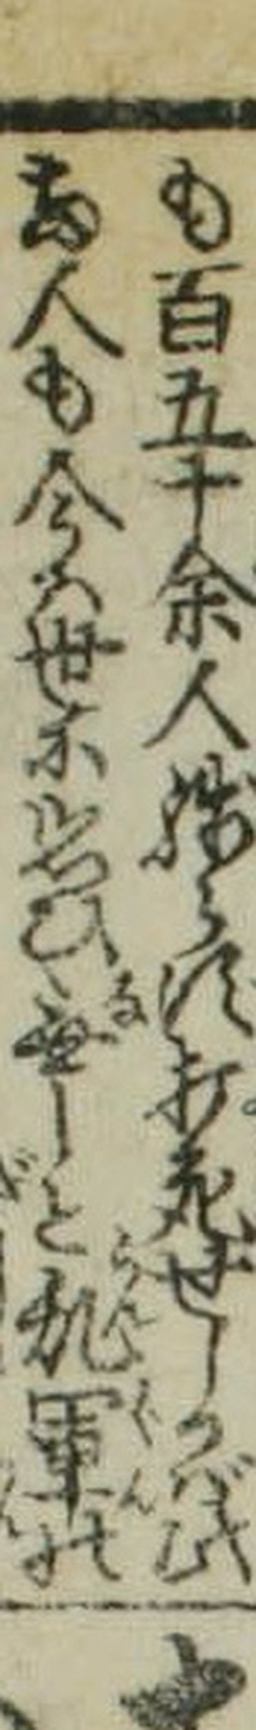両人も今は世に思ひ無しと乱軍の
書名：續英雄百人一首
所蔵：東京学芸大学附属図書館
